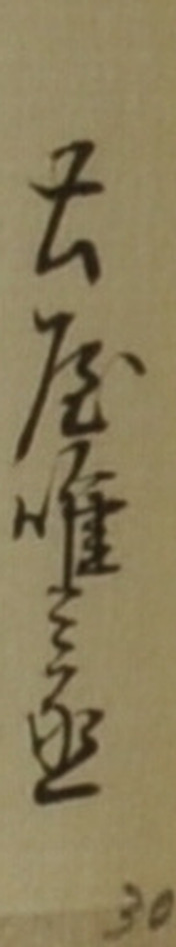土屋唯之丞
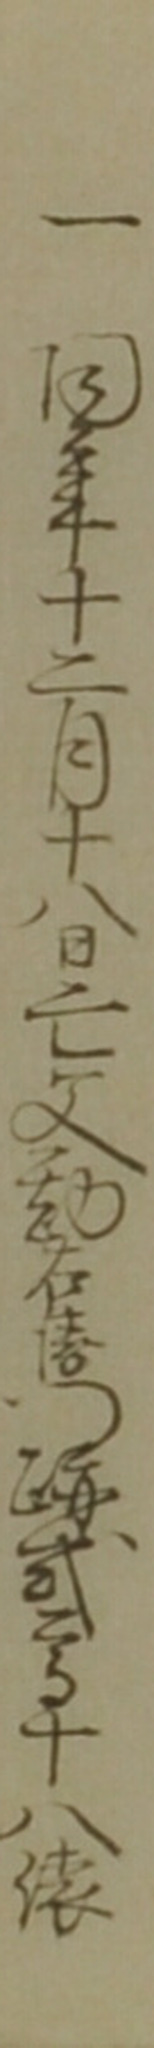一同年十二月十八日亡父勘右衛門跡式高十八俵
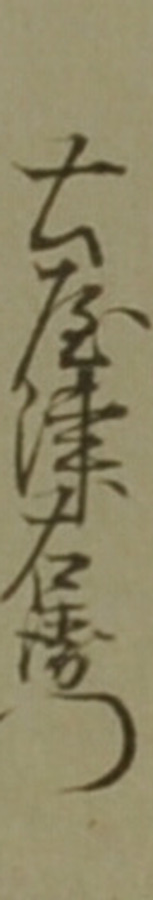土屋津右衛門
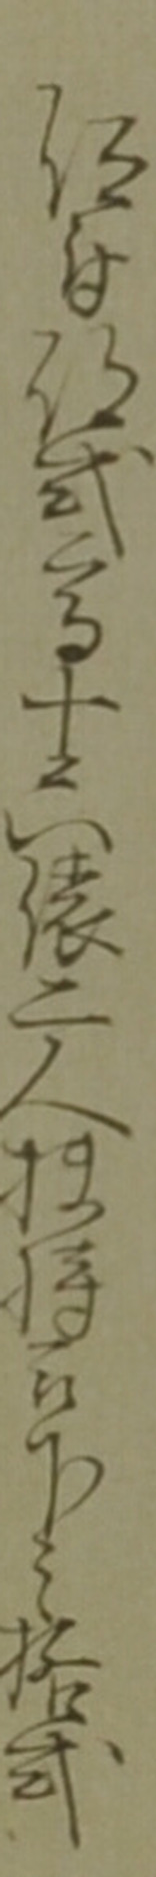仰付跡式高十六俵二人被下之格式
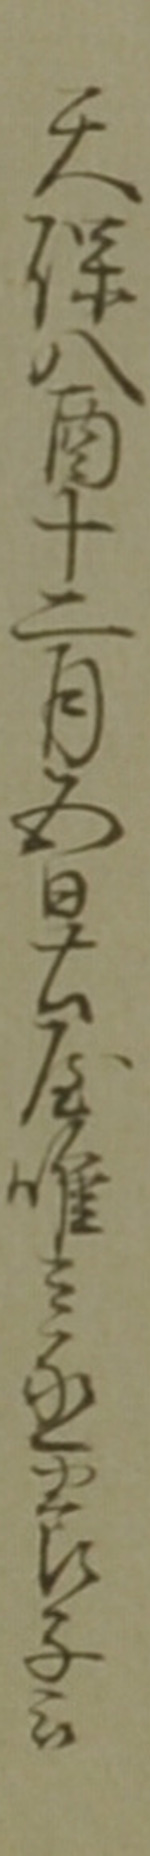一天保八酉十二月五日土屋唯之丞養子被
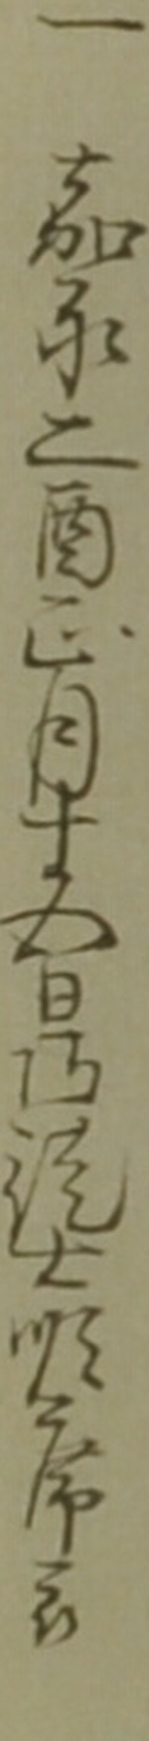一嘉永二酉正月十五日御徒士順席被
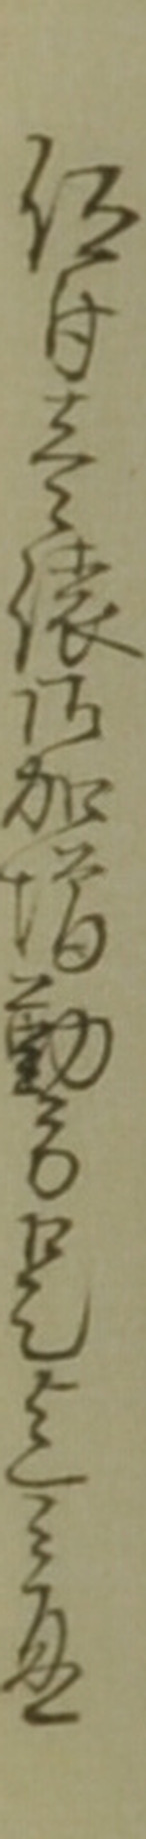仰付壱俵御加増勤方是迄之通

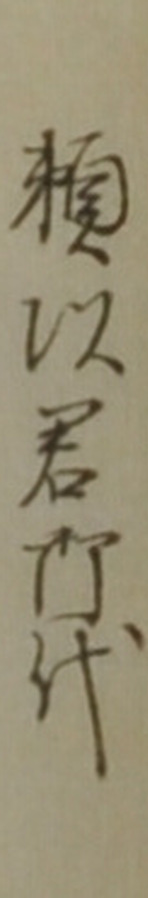頼以君御代
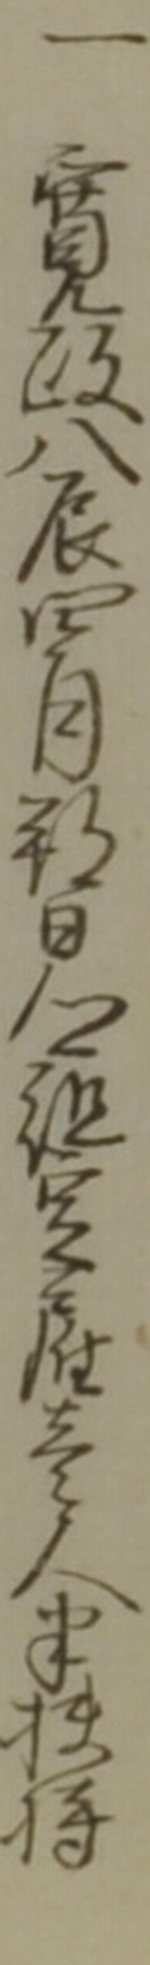一寛政八辰四月朔日郷組足壱人半扶持
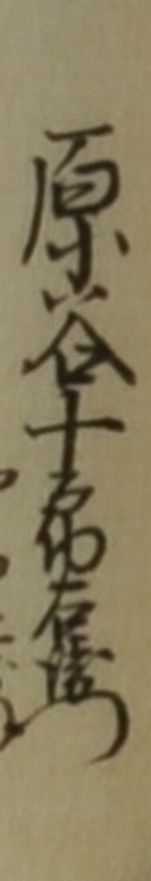原谷十郎右衛門
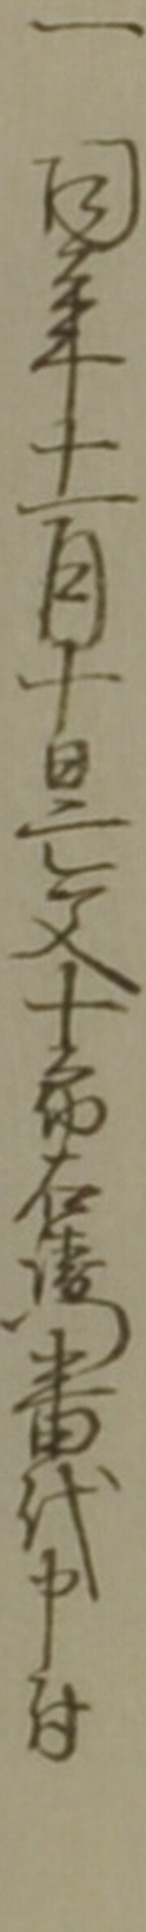一同年十一月十日亡父十郎右衛門番代申付
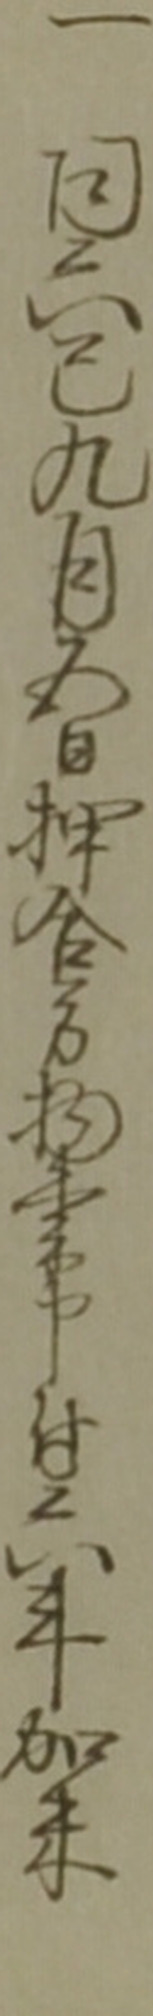一同六巳九月五日押合方物書申付六斗加米
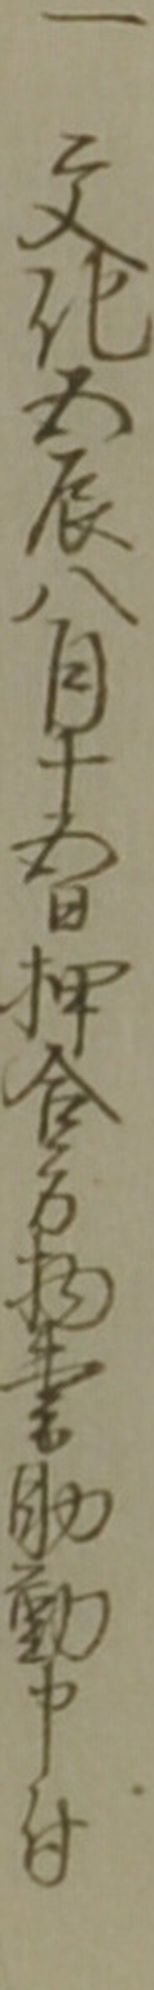一文化五辰八月十五日押合方物書助勤申付
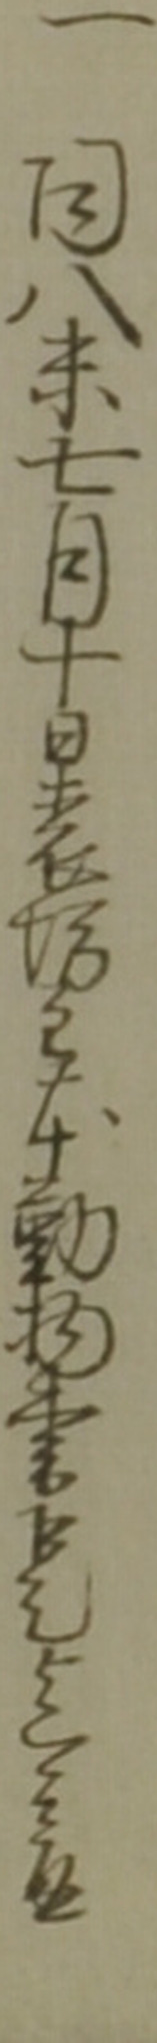一同八未七月十日表坊主本勤物書是迄之通
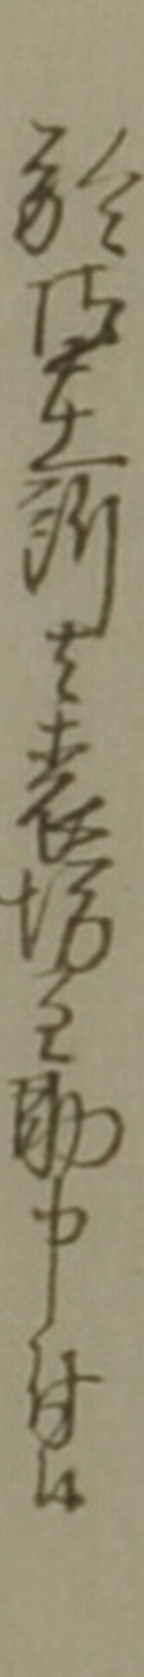於御在所は表坊主助申付候
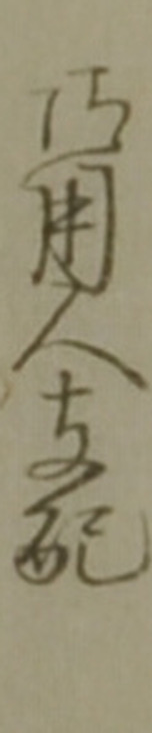御用人支配
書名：無足諸士勤仕録（六）
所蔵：伊那市立高遠町図書館・合同会社AMANE
